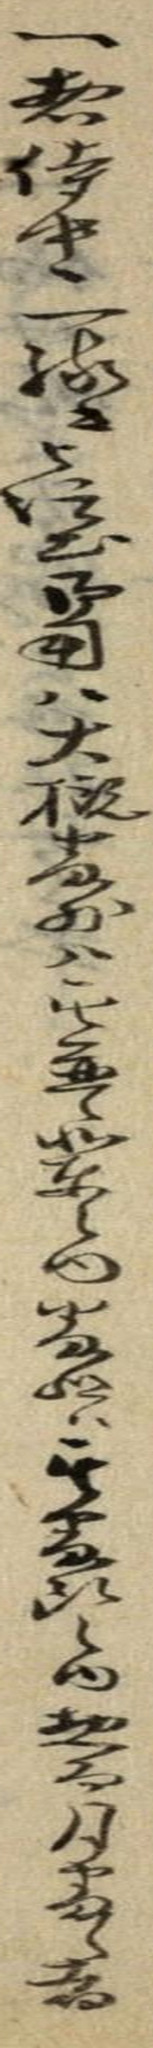一惣侍中へ一統に被仰出御用は大概番外は其並之輩之内番組は其番頭之内惣て月番之者
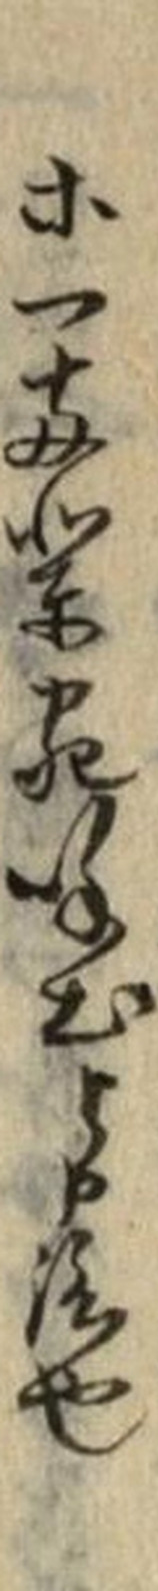等一両輩宛呼出被申渡也
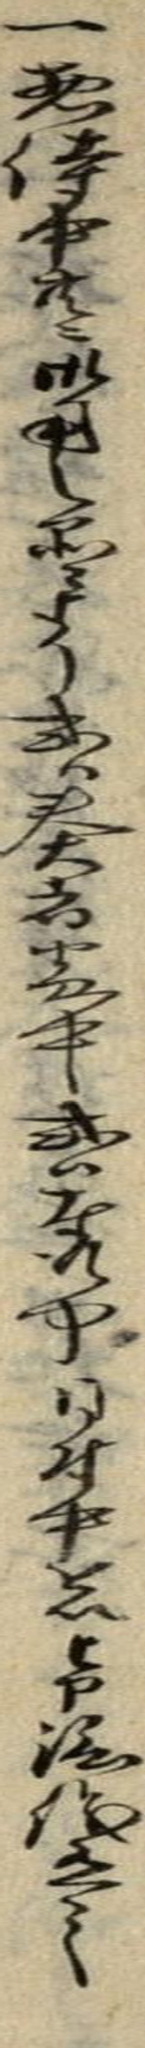一惣侍中共に御用之品により或は奏者番中或は奉行中目付中を以被申渡儀有之
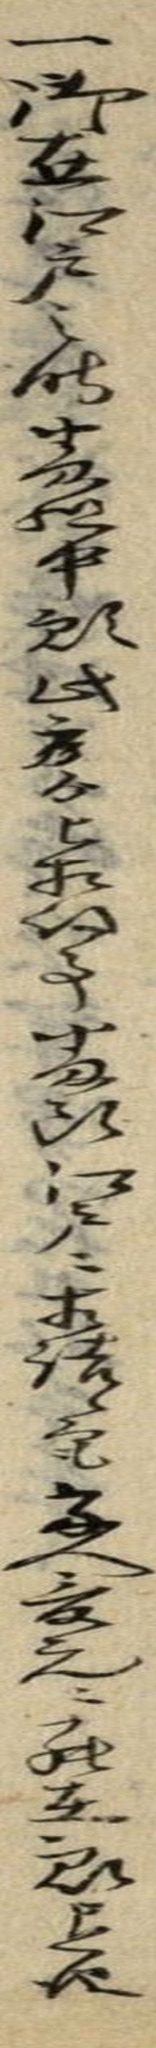一御在江戸の時番組中願此方ゟ被相伺事番頭江戸に相詰候ても当人爰元に罷在願申上儀
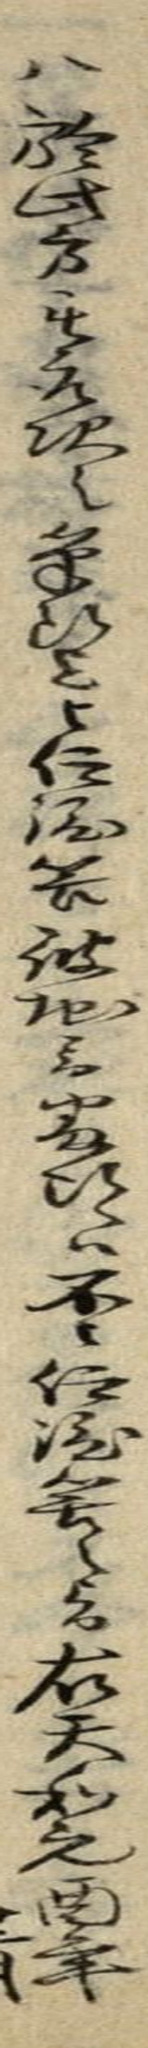は於此方其取次之筆頭迄被仰渡筈彼地に而番頭へは不被仰渡筈之旨右天和元酉年十二月
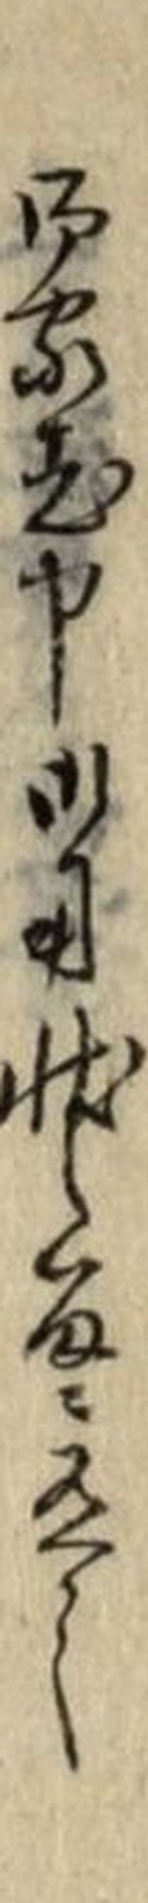御家老中御用状之留に有之
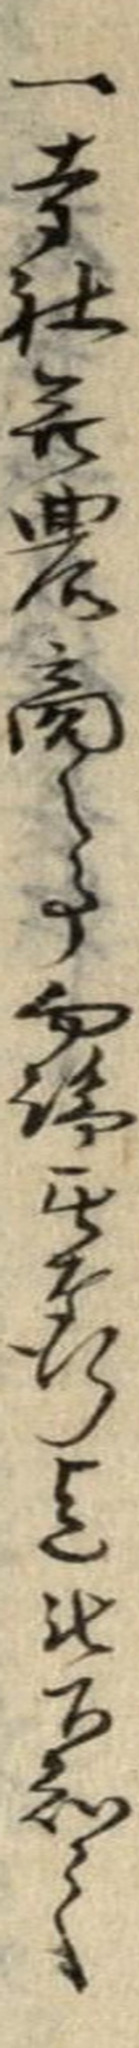一寺社并農商之事勿論其奉行迄被下知之
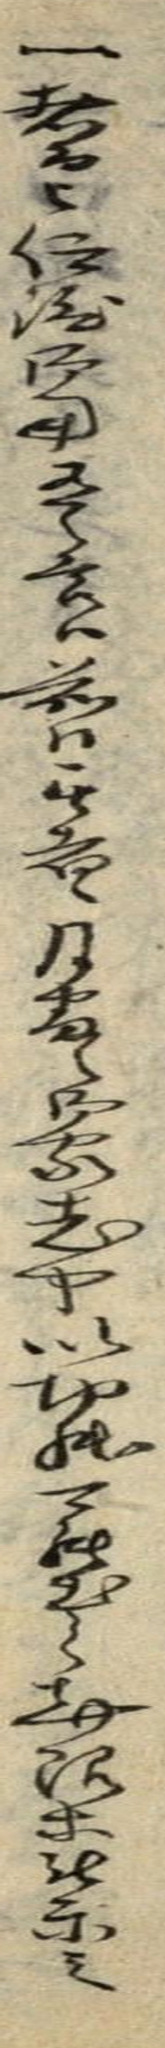一惣而被仰渡御用有之節は前日其者へ月番之御家老中以切紙可罷出之刻限等被示之
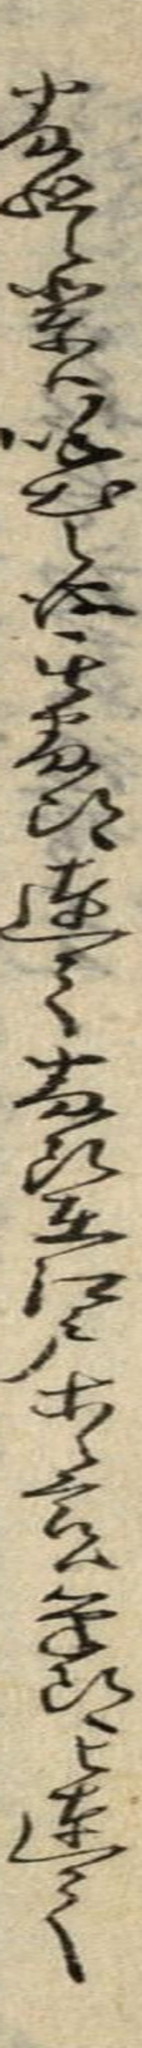番組之輩は呼出之儀其番頭へ達之番頭在江戸等之節は筆頭へ申達之
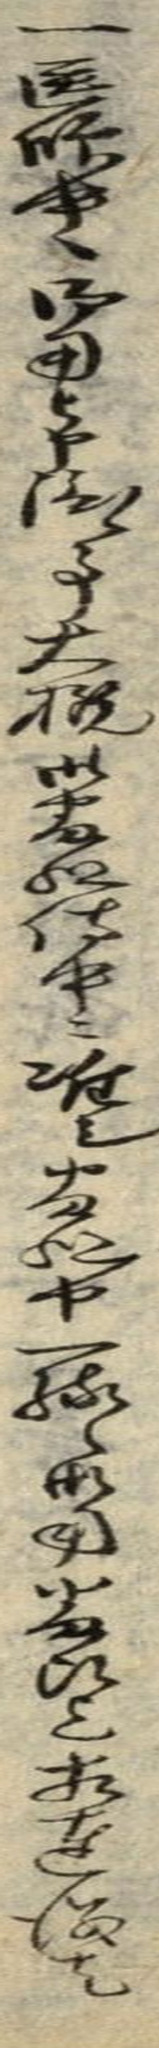一医師中へ御用被申渡候事大概御番組侍中に准し番組中一統之御用番頭迄相達儀は
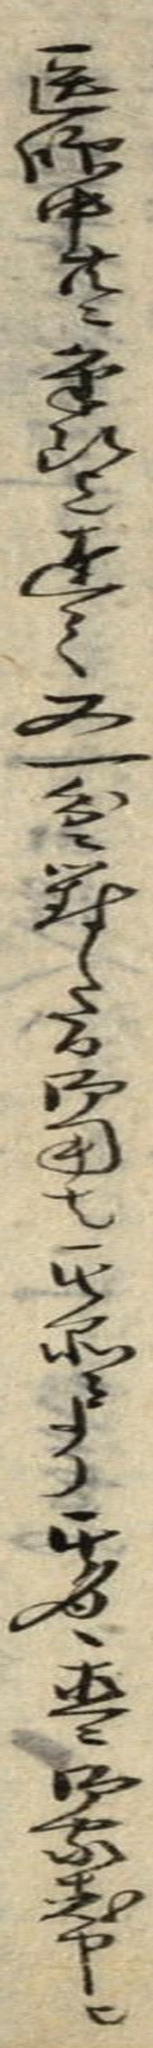医師中共に筆頭迄達之又一分に対したる御用は其品により其身へ直々御家老中被
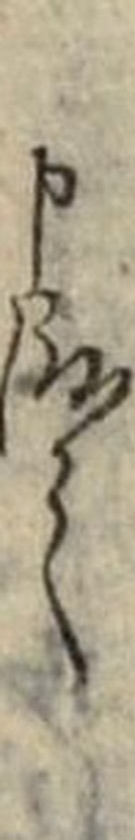申渡之
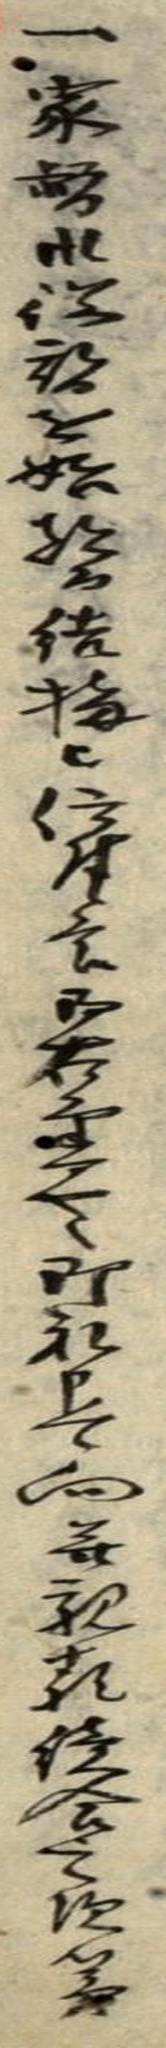一家督御役替を始都而結構被仰付候節御右筆部やへ御礼申上候向并親類続合之次第

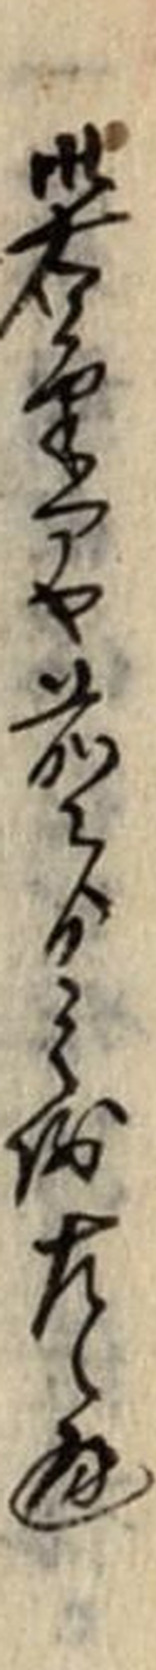御右筆部や前々ゟ之例左之通
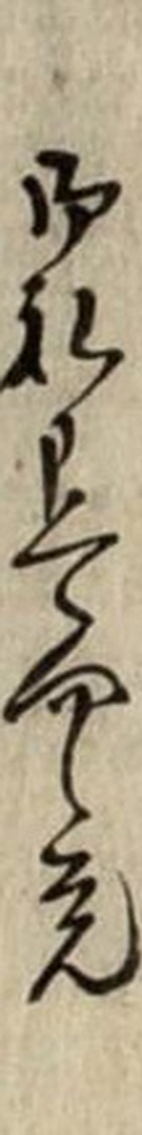御礼申上候向之覚
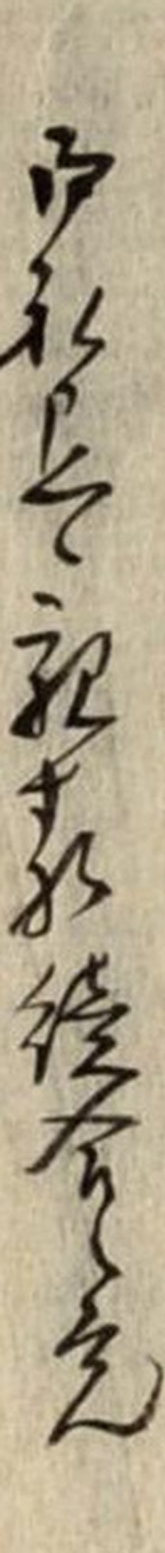御礼申上候親類続合之覚
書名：御用并被仰出之部
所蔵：福井県文書館 Fukui Prefectural Archives
